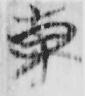東
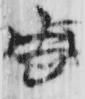周
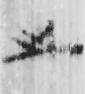之
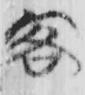客
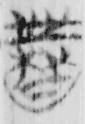○（許）
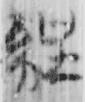○（盈）
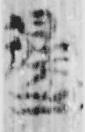歸
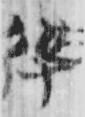{尸拃}（胙）
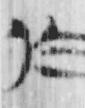於
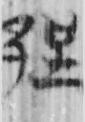郢
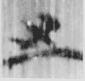之
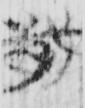歲（歲）
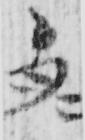十月
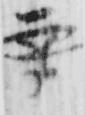辛
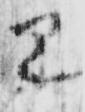巳
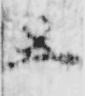之
